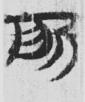所
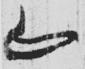㠯（以）
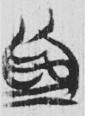爲
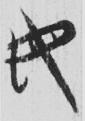母
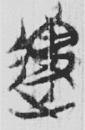退
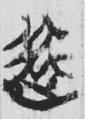○（率）
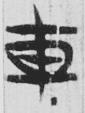車
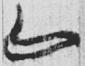㠯（以）
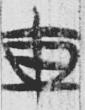車
